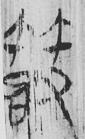鼓
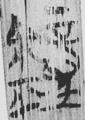鐘
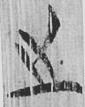之
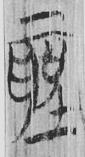聖（聲）
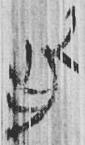此
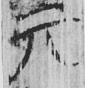亓（其）
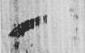一
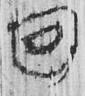回
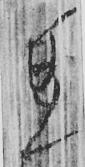也
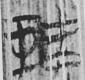○（珪玉）
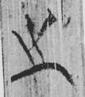之
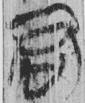君
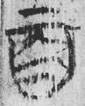百
